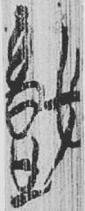○（愷）
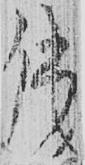俤
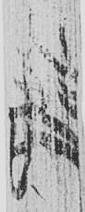若
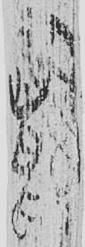豹
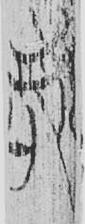若
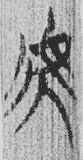虎
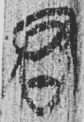君
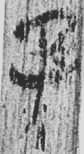子
